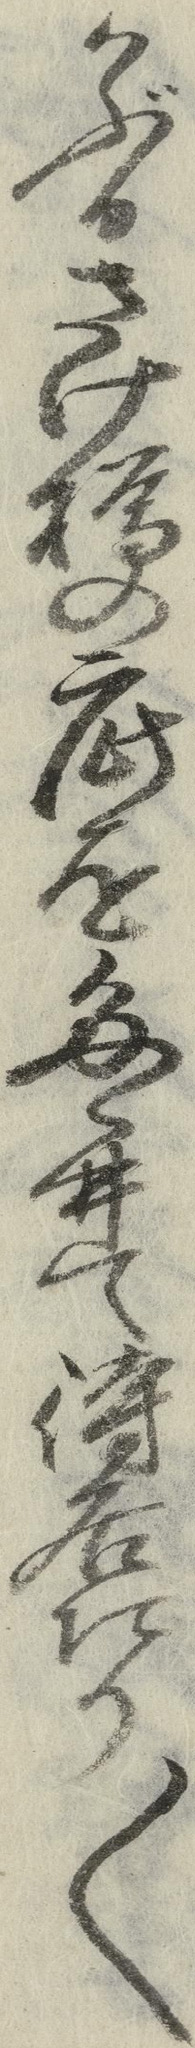かぶるさけ樽の底をたゝ井て待居たり〳〵

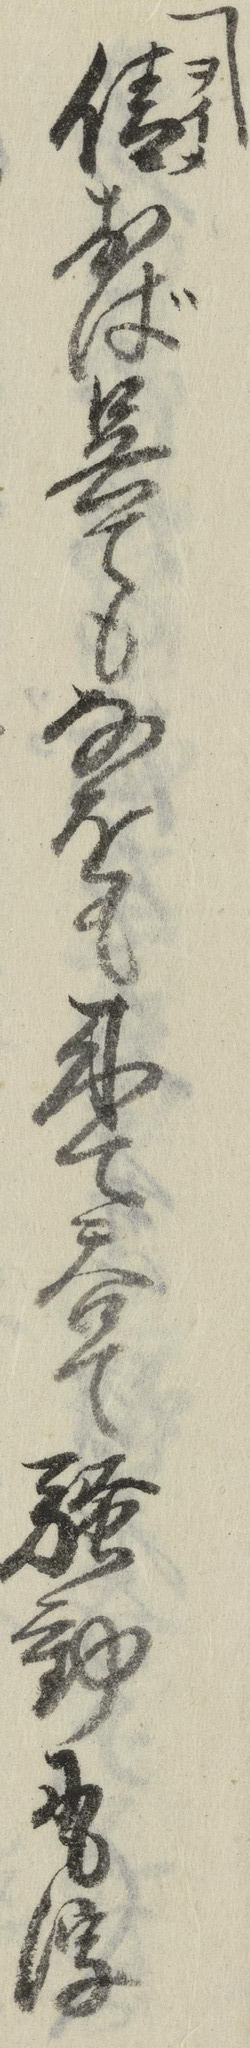〽債おば呉てもなをも来て呑て騒動にも浮
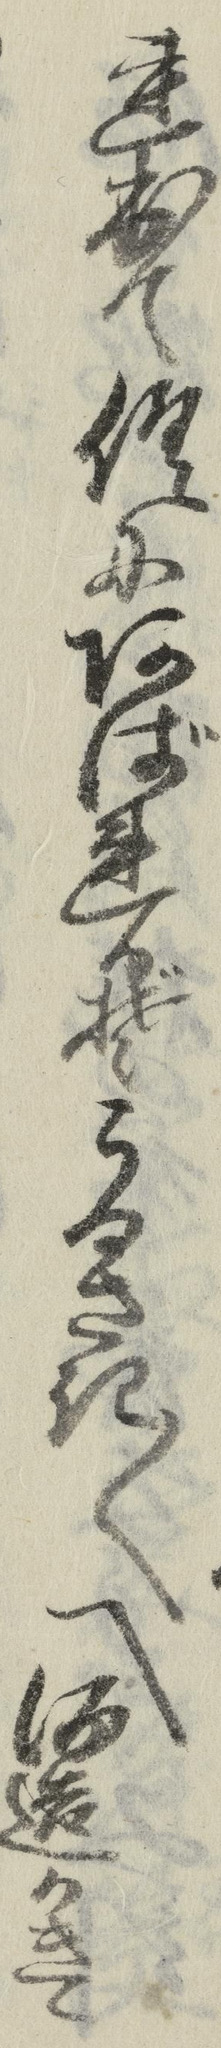れ出て倶にあばれるぞうるさき〳〵〽酒造かきて
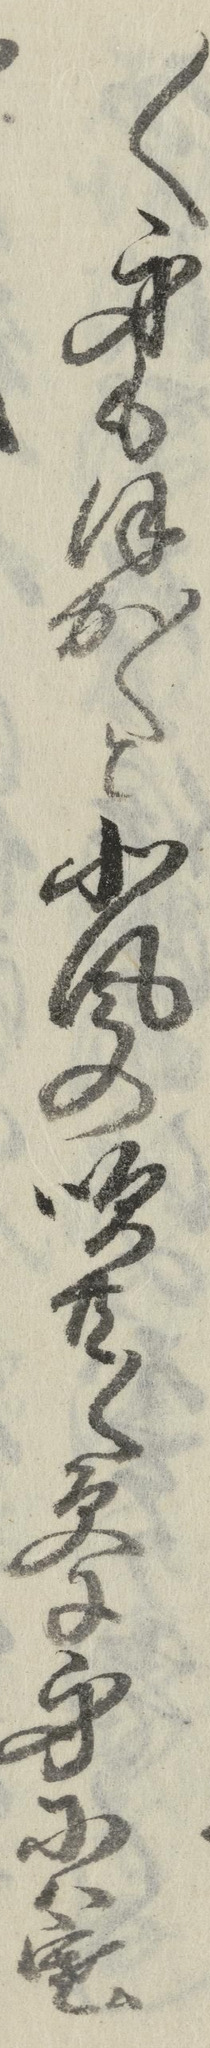〳〵身もほか〳〵と北風の吹共〳〵更に身には寒
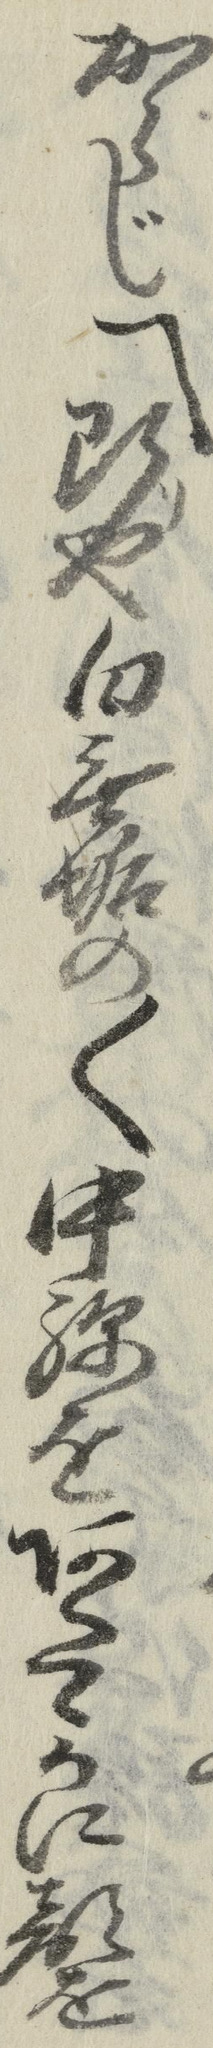からじ〽断白無垢の〳〵中綿をあたゝかに顔を
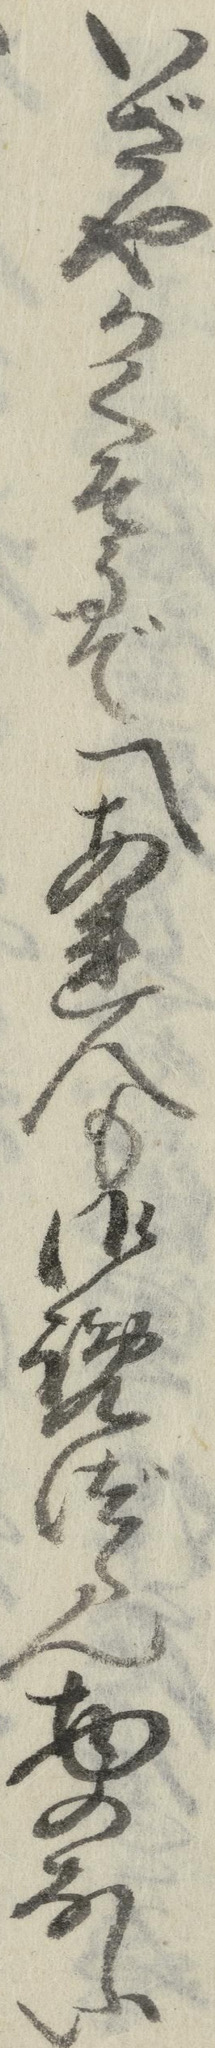いざやかくそ事ぞ〽あれ人も御覧づらん物のならい
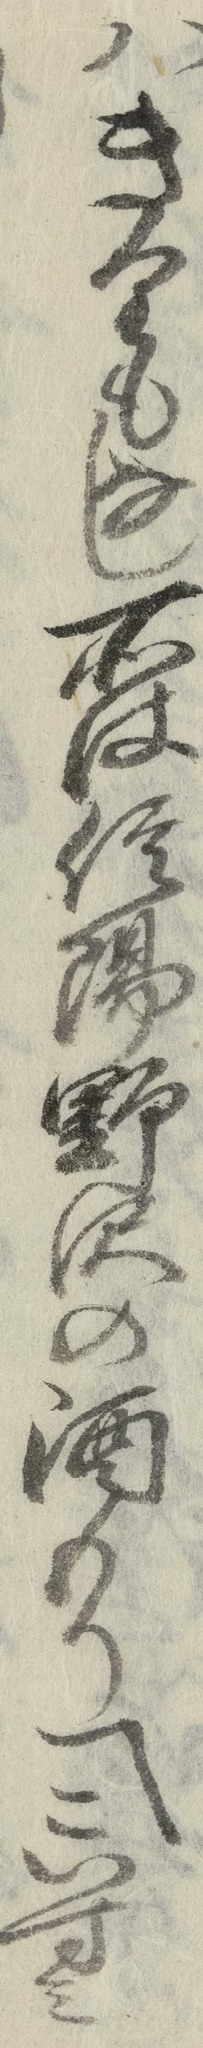はきくもなし所は信陽野沢の酒もり〽こいすみ
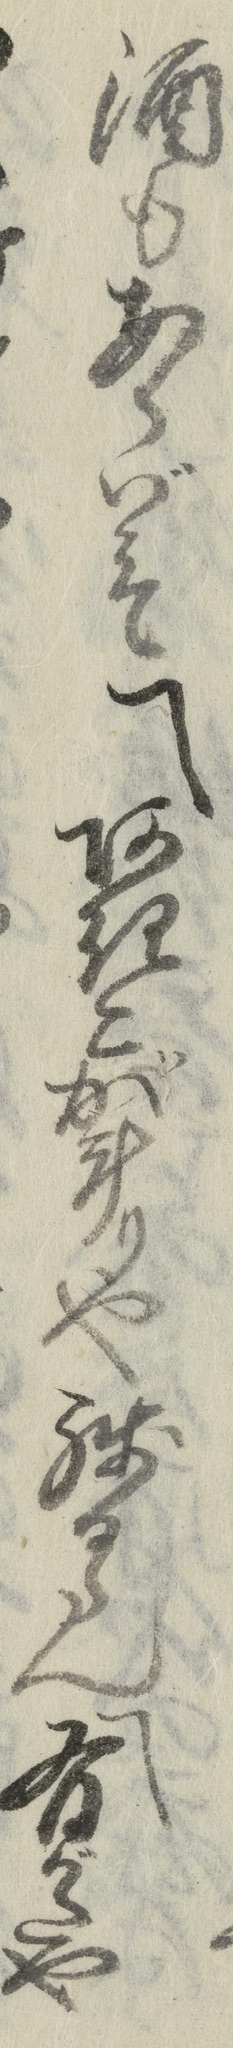酒もあらばとて〽あきこが計りや残るらん〽有がたや
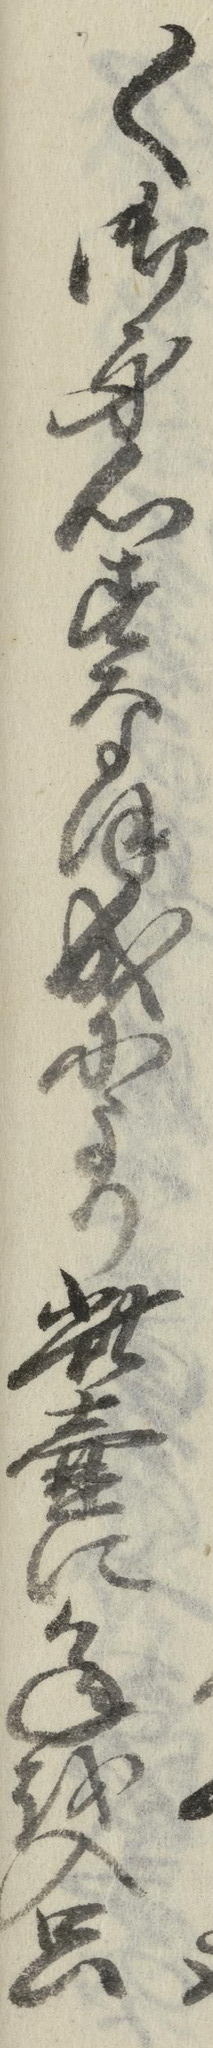〳〵御身心すなほ成により此壺にかねを入只
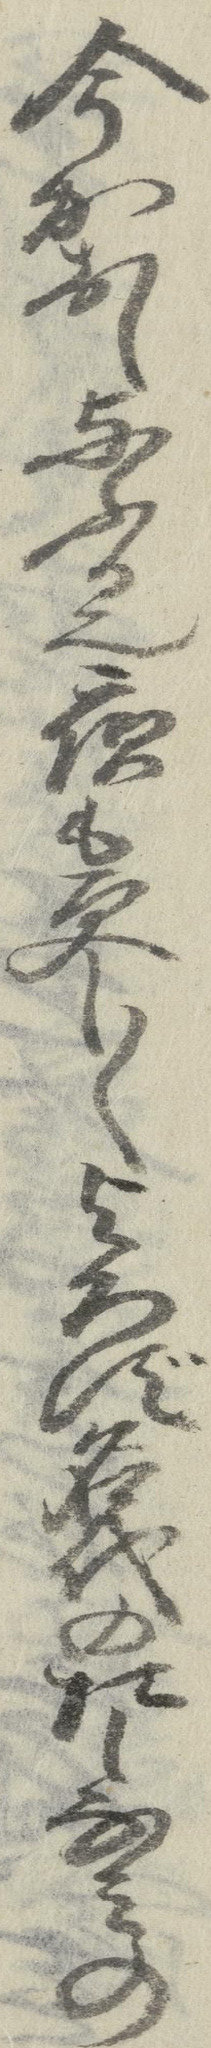今か出し与ふる也夜も更しくよろず名代のたしなみの
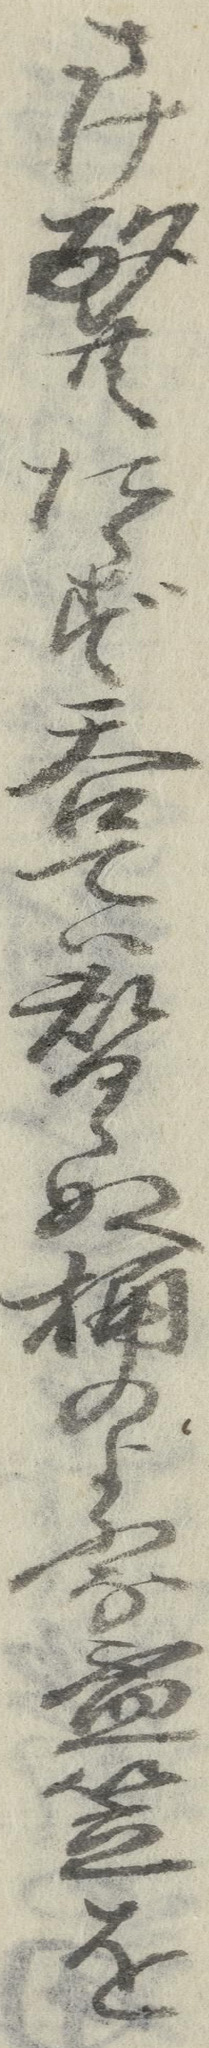さけ酌共たゝず呑ては替らぬ桶のよふな盃笠を
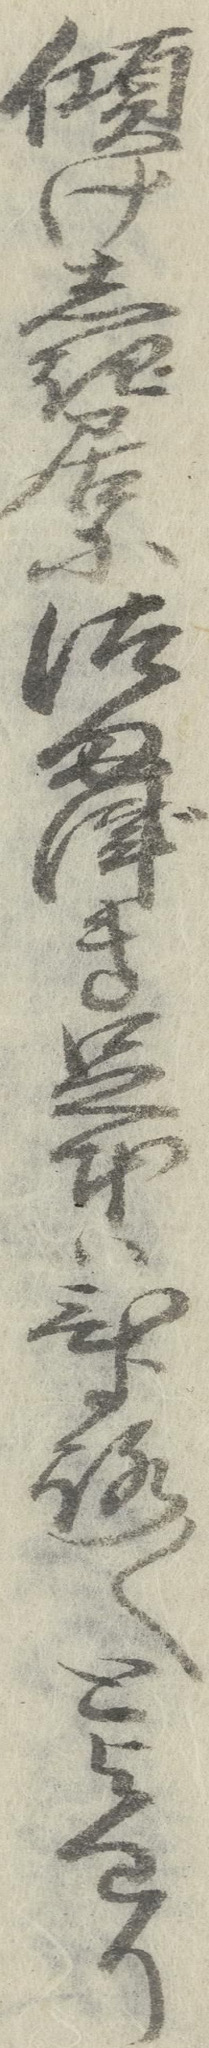傾けしき居につまづき足本はひよ路〳〵とよわり
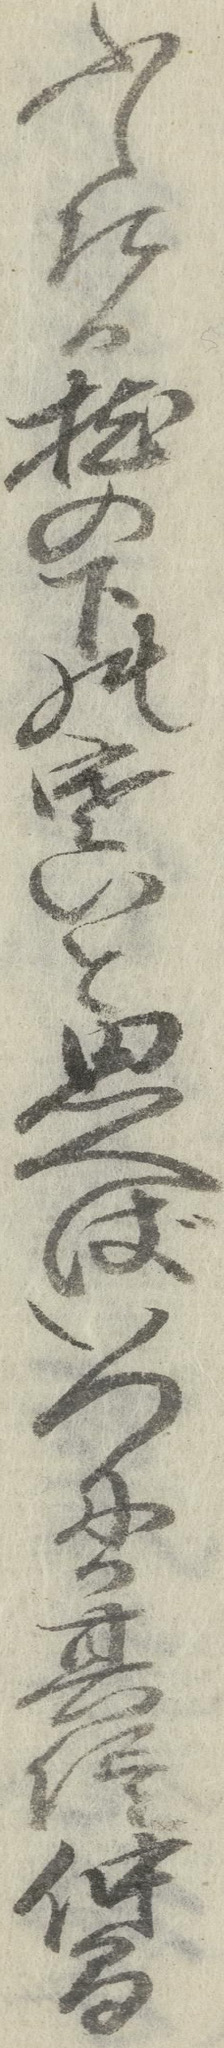ふしたる松の下の寒いと思へばいつにか其侭仲間
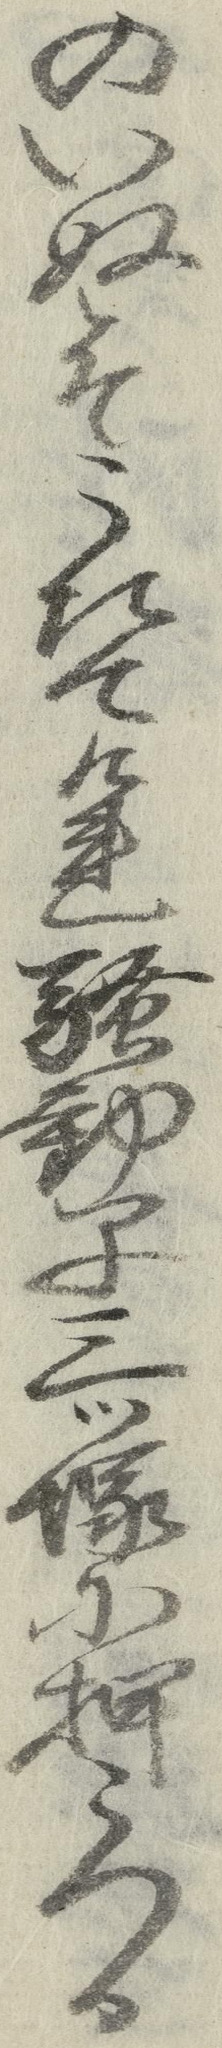のいぬゝそうたてけれ騒動早三ツ塚に押々つる
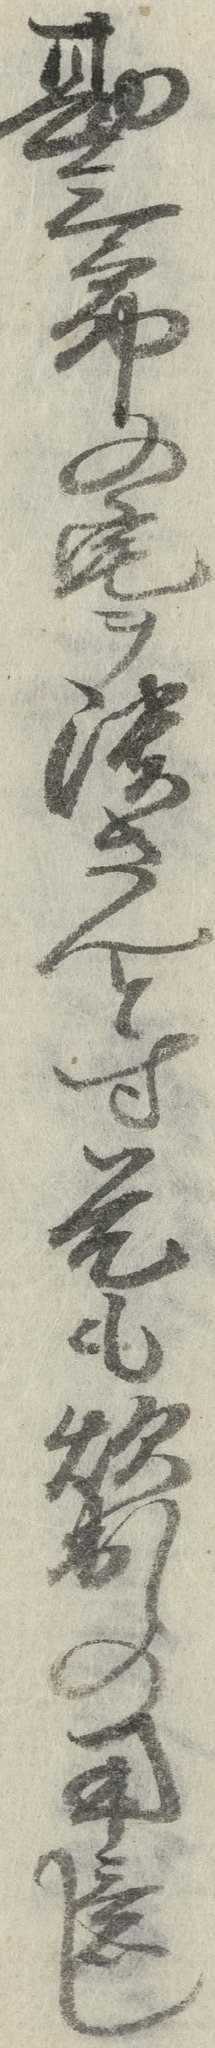勘三郎の宅ヲ潰さんとす是も炊出しの用意し
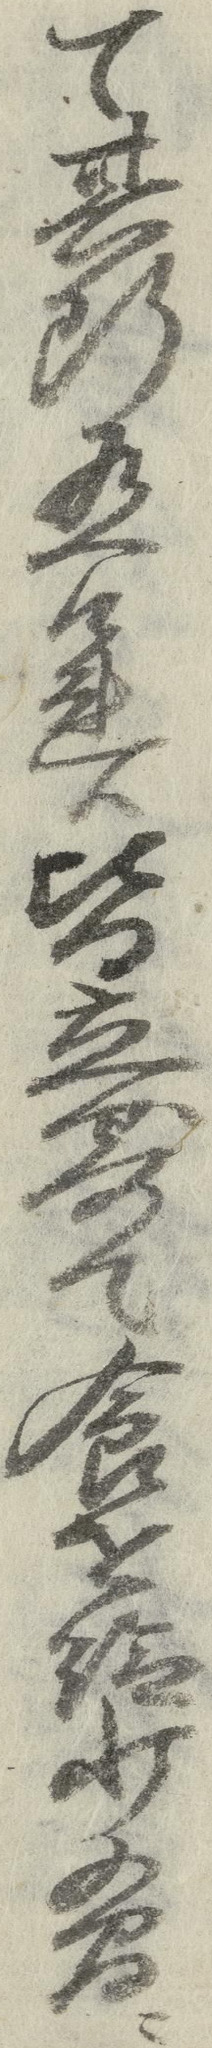て其断有けれは皆立寄て食を給少の間に
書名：浅間大焼騒動記　中
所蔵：東京大学地震研究所図書室 Earthquake Research Institute Library, The University of Tokyo, JAPAN
